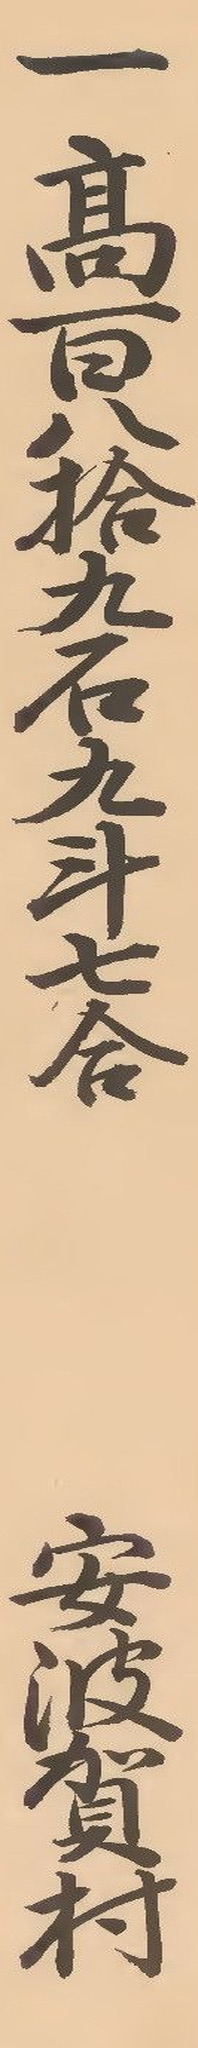一高百八拾九石九斗七合安波賀村

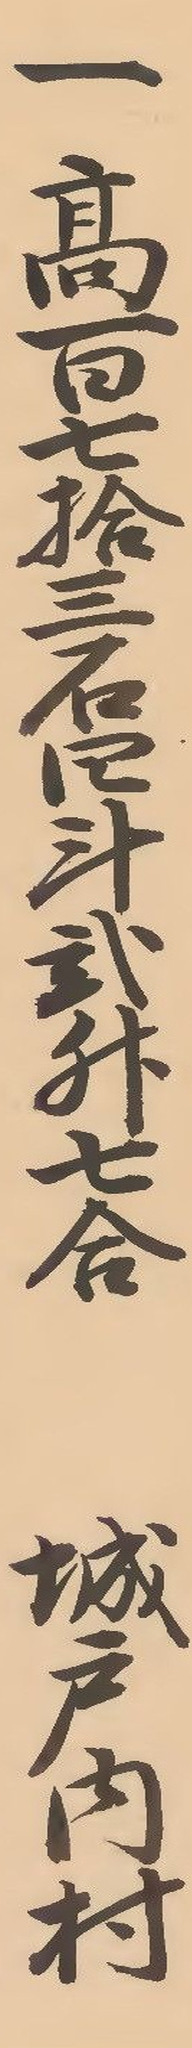一高百七拾三石四斗弐升七合城戸内村
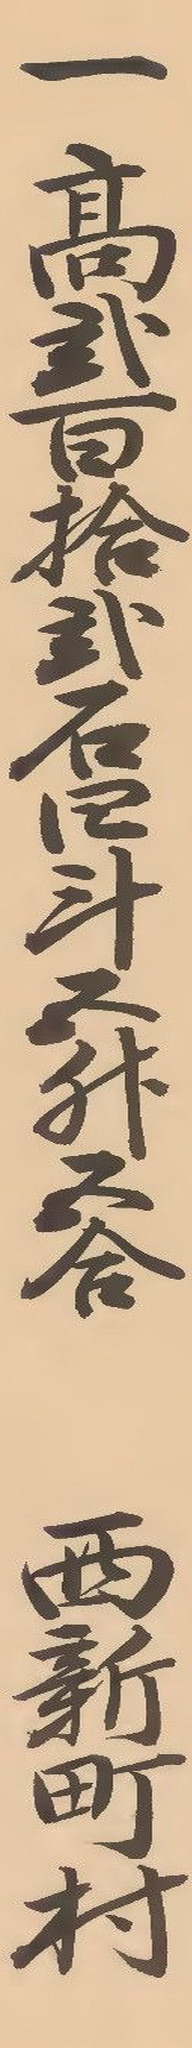一高弐百拾弐石四斗五升五合西新町村
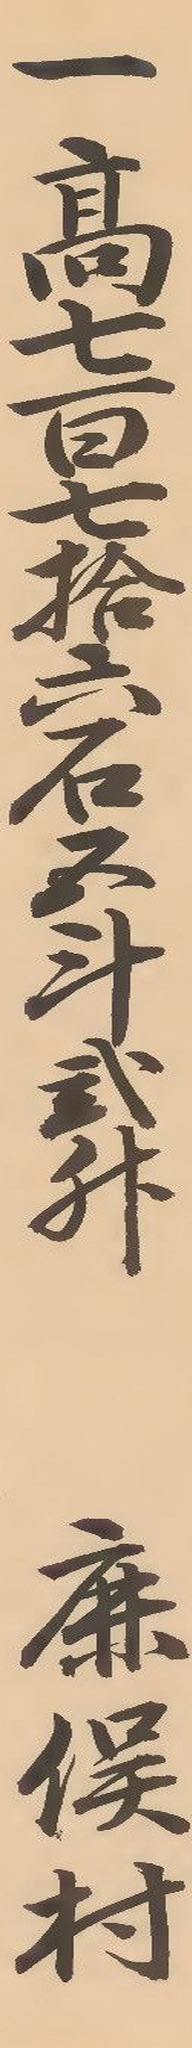一高七百七拾六石五斗弐升鹿俣村
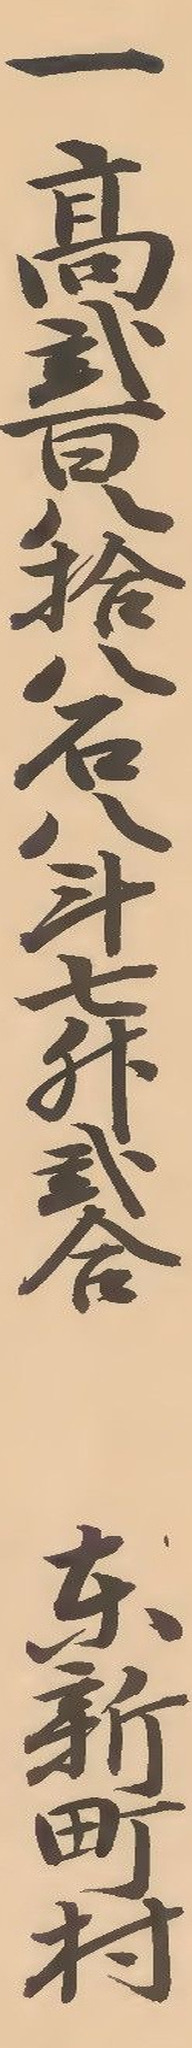一高弐百八拾八石八斗七升弐合東新町村
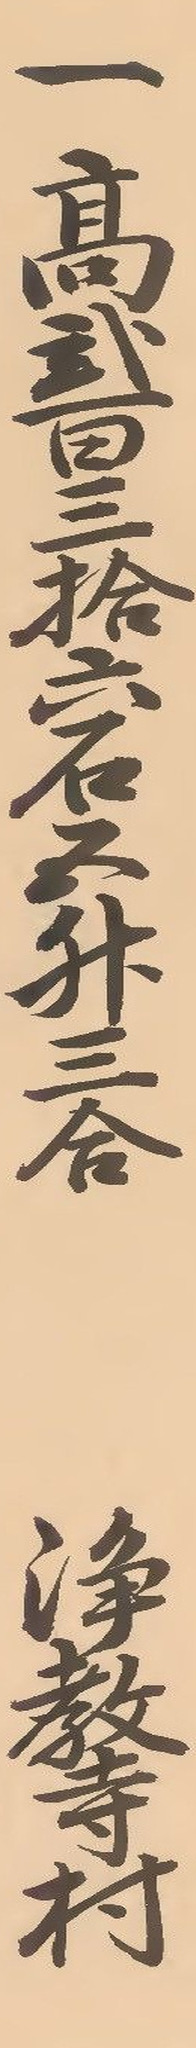一高弐百三拾六石五升三合浄教寺村
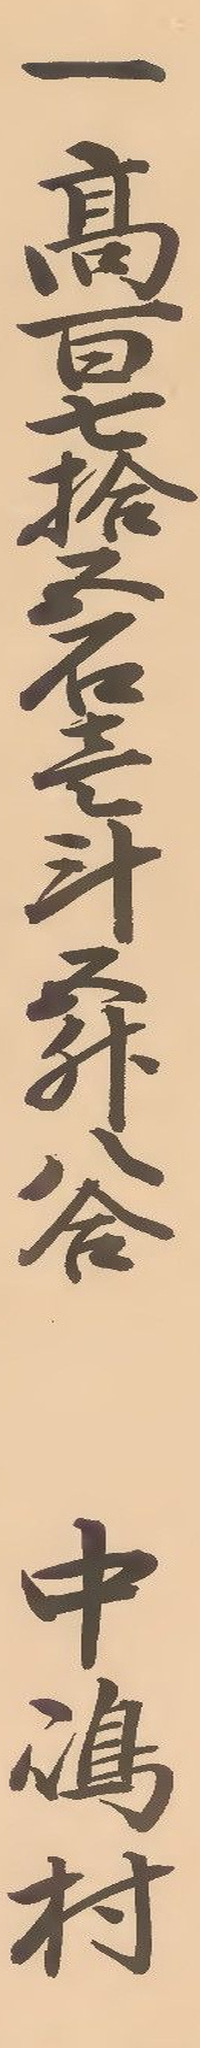一高百七拾五石壱斗五升八合中島村
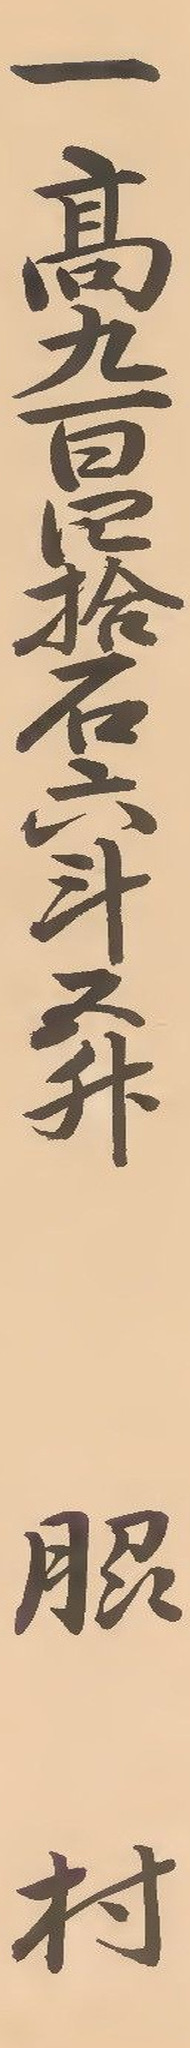一高九百四拾石六斗五升脇村
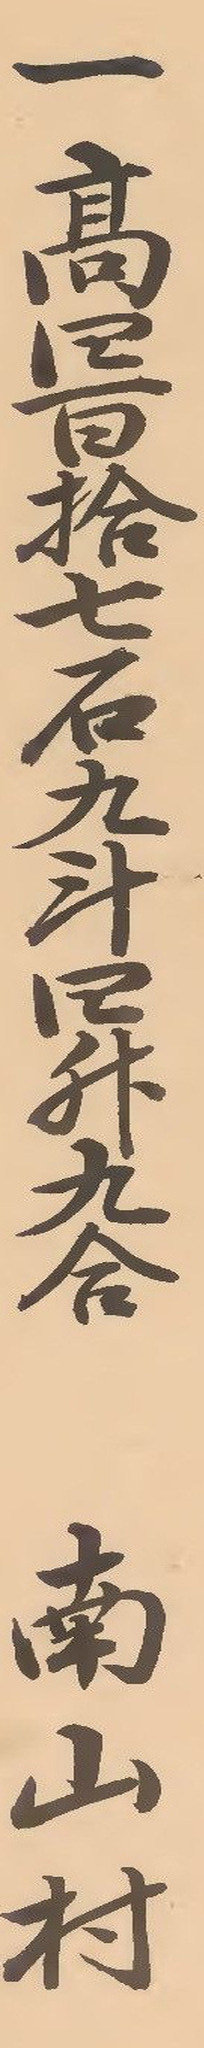一高四百拾七石九斗四升九合南山村

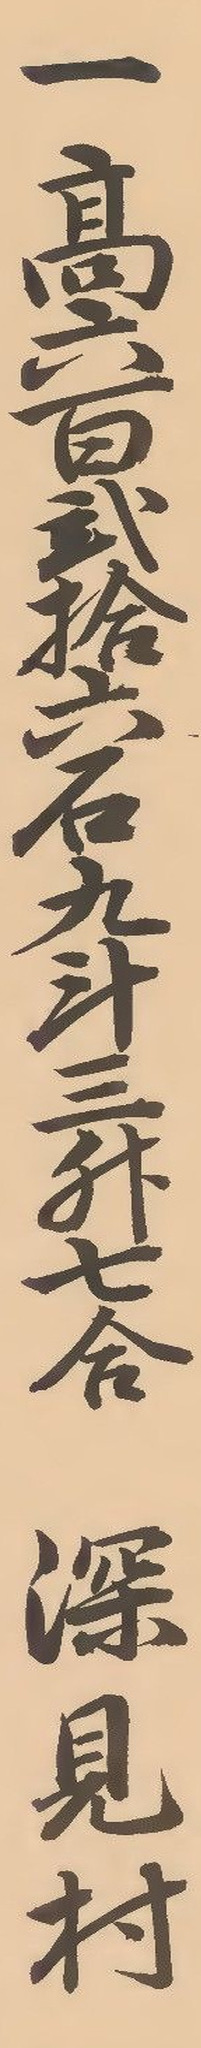一高六百弐拾六石九斗三升七合深見村
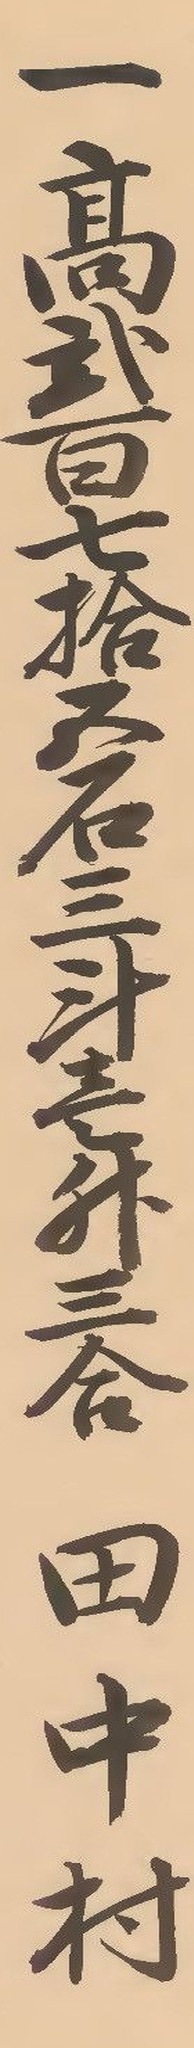一高弐百七拾五石三斗壱升三合田中村
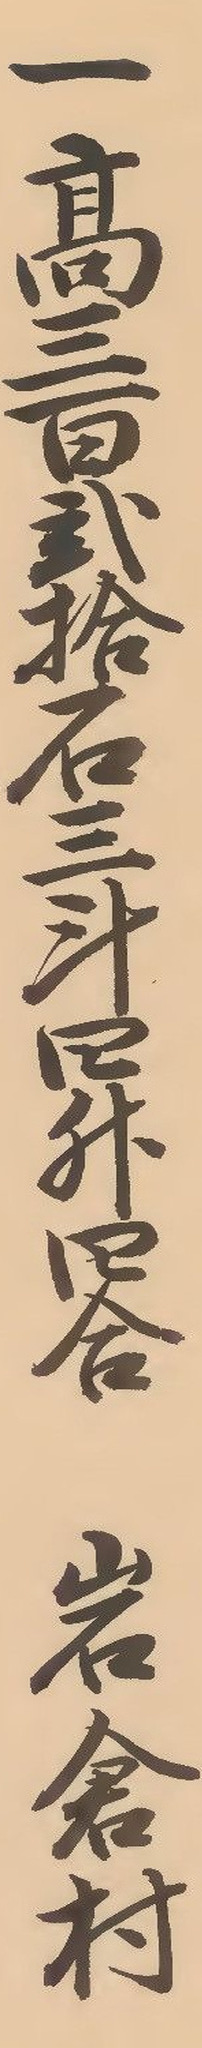一高三百弐拾石三斗四升四合岩倉村
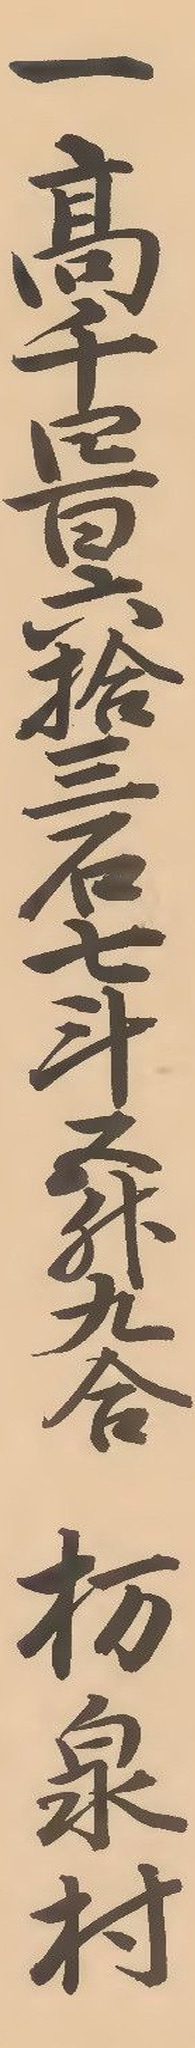一高千四百六拾三石七斗五升九合栃泉村
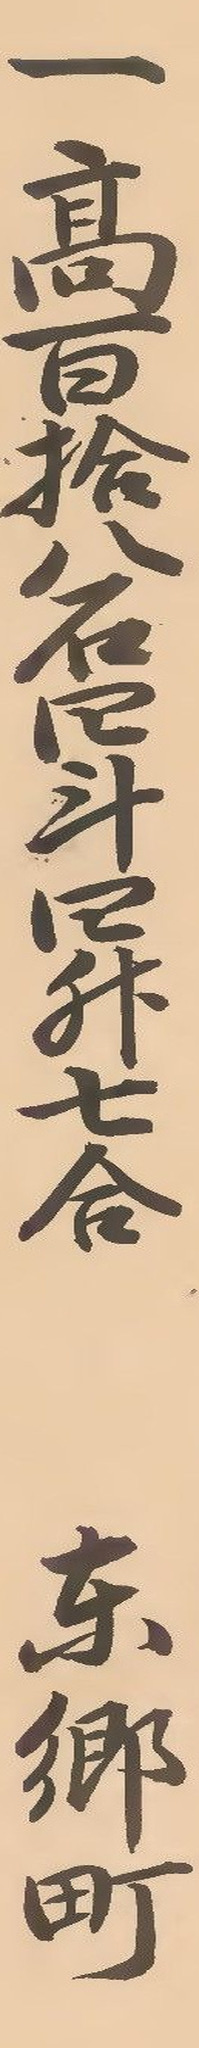一高百拾八石四斗四升七合東郷町
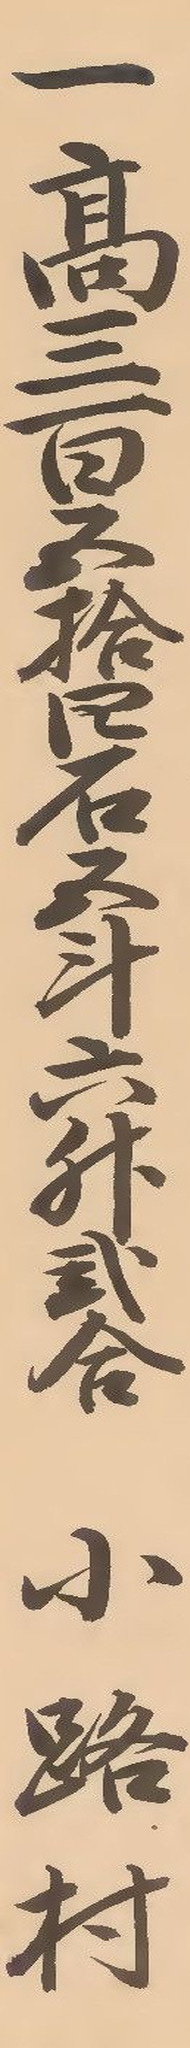一高三百五拾四石五斗六升弐合小路村

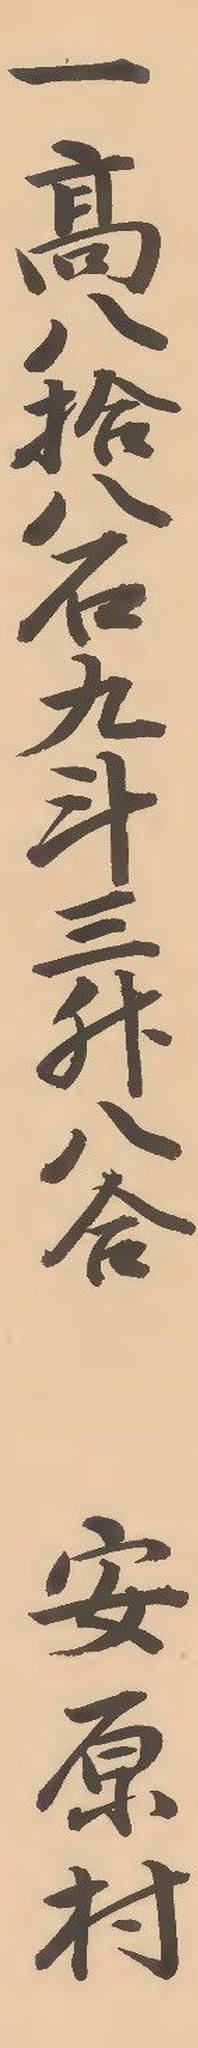一高八拾八石九斗三升八合安原村
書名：越前国郷帳
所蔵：国立公文書館 National Archives of Japan
